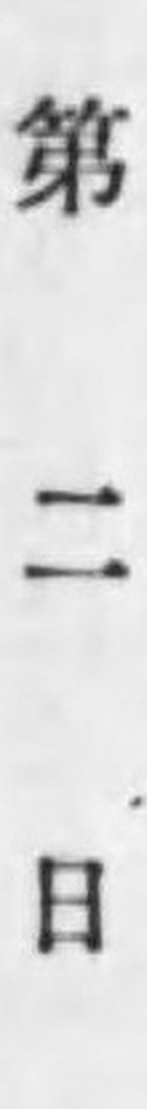第二日
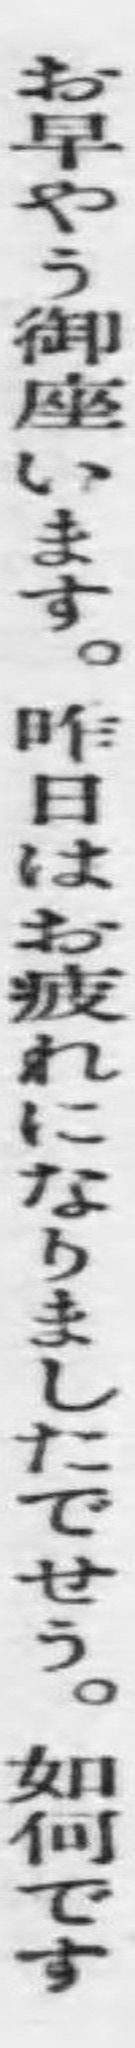お早やう御座います。昨日はお疲れになりましたでせう。如何です
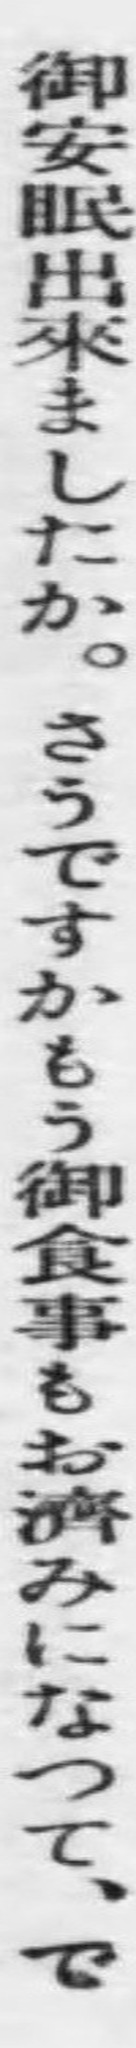御安眠出来ましたか。さうですかもう御食事もお済みになつて、で
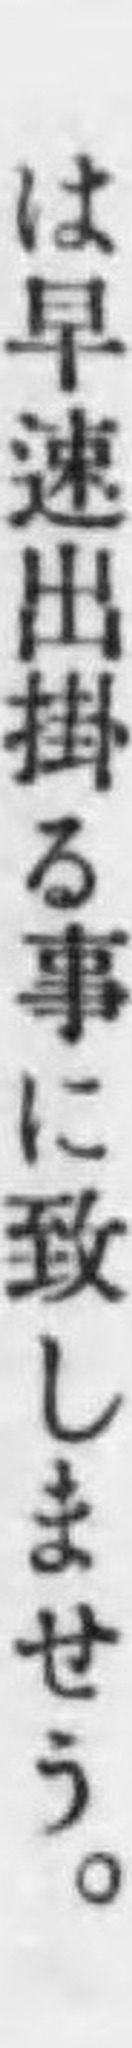は早速出掛る事に致しませう。
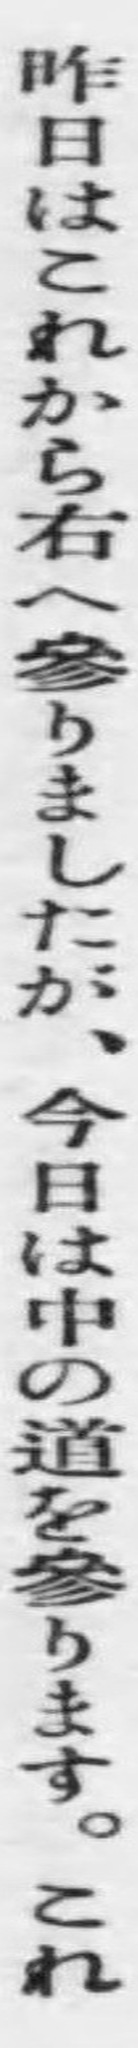昨日はこれから右へ参りましたが、今日は中の道を参ります。これ
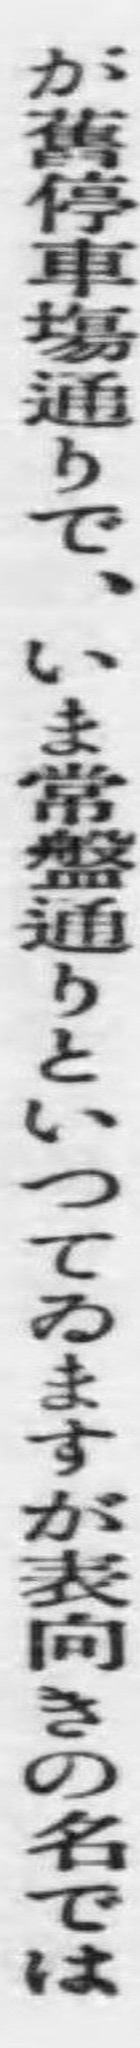が旧停車場通りで、いま常盤通りといつてゐますが表向きの名では
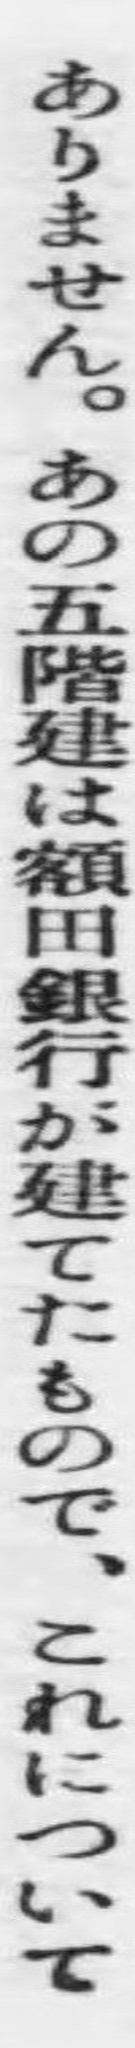ありません。あの五階建は額田銀行が建てたもので、これについて
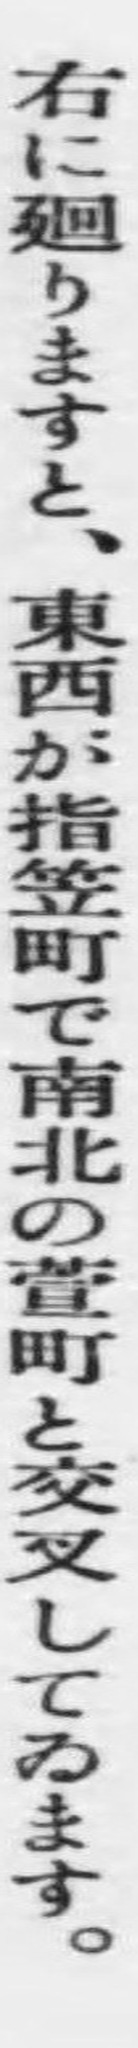右に廻りますと、東西が指笠町で南北の萱町と交叉してゐます。
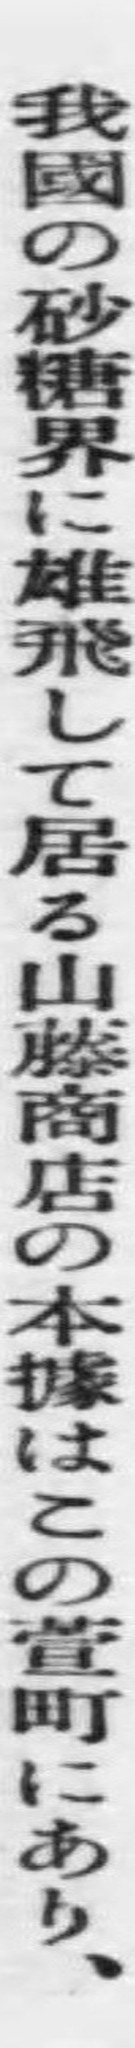我国の砂糖界に雄飛して居る山藤商店の本拠はこの萱町にあり、
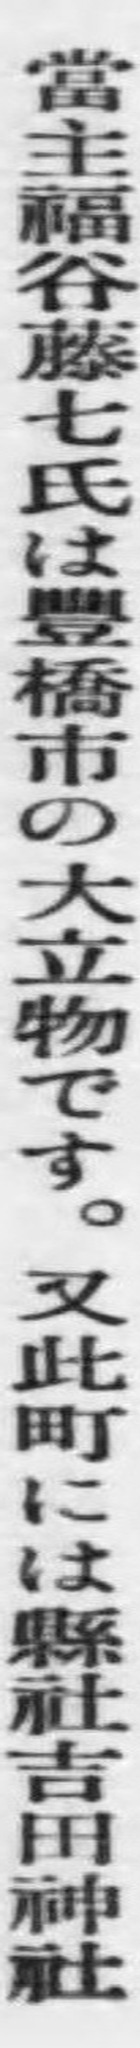当主福谷藤七氏は豊橋市の大立物です。又此町には県社吉田神社
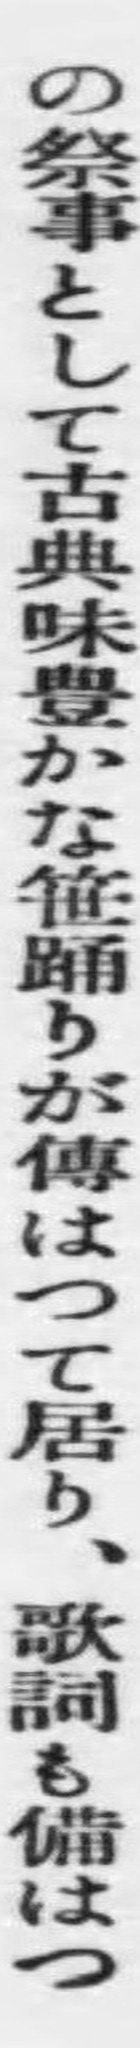の祭事として古典味豊かな笹踊りが伝はつて居り、歌詞も備はつ

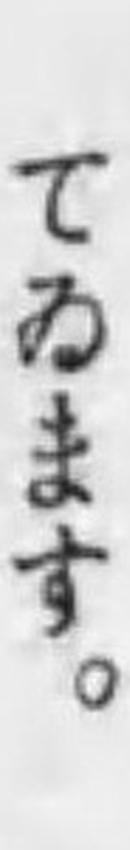てゐます。
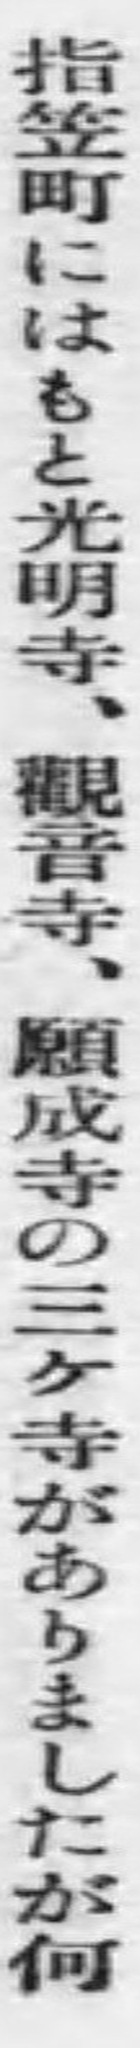指笠町にはもと光明寺、観音寺、願成寺の三ヶ寺がありましたが何
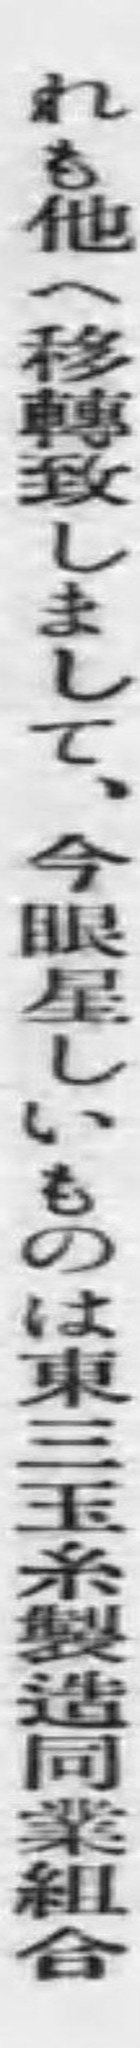れも他へ移転致しまして、今眼星しいものは東三玉糸製造同業組合
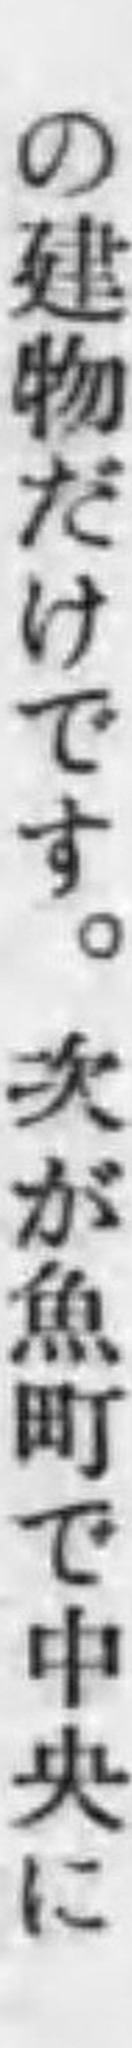の建物だけです。次が魚町で中央に
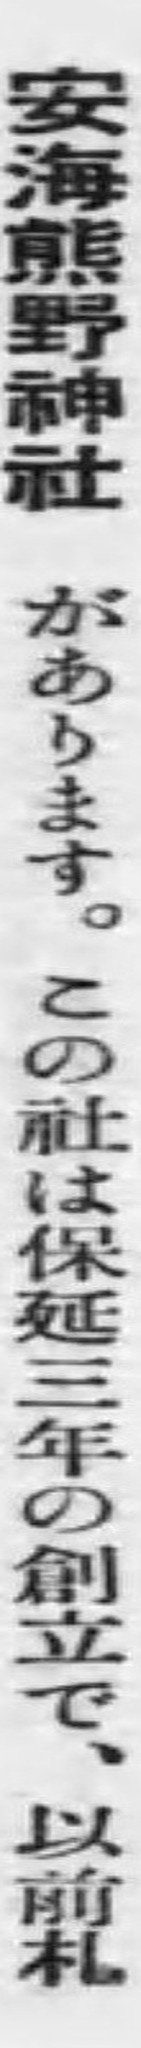安海熊野神社があります。この社は保延三年の創立で、以前札
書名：東三河道中記 : 豊橋市及其附近案内
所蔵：国立国会図書館 National Diet Library, JAPAN
